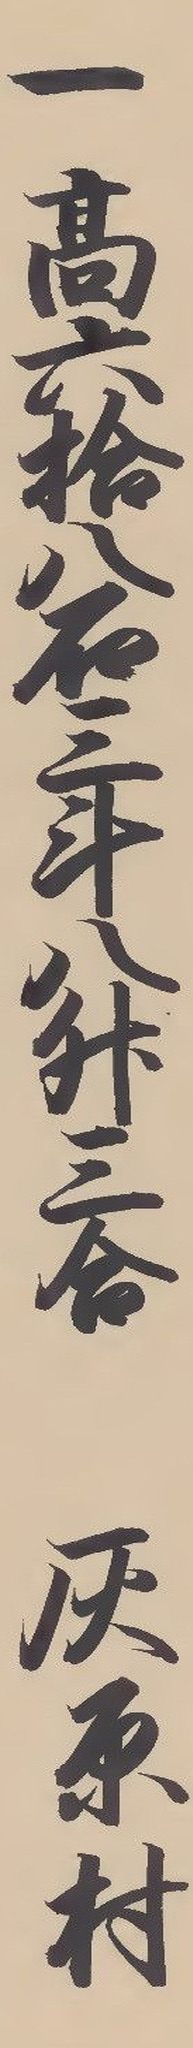一高六拾八石三斗八升三合灰原村
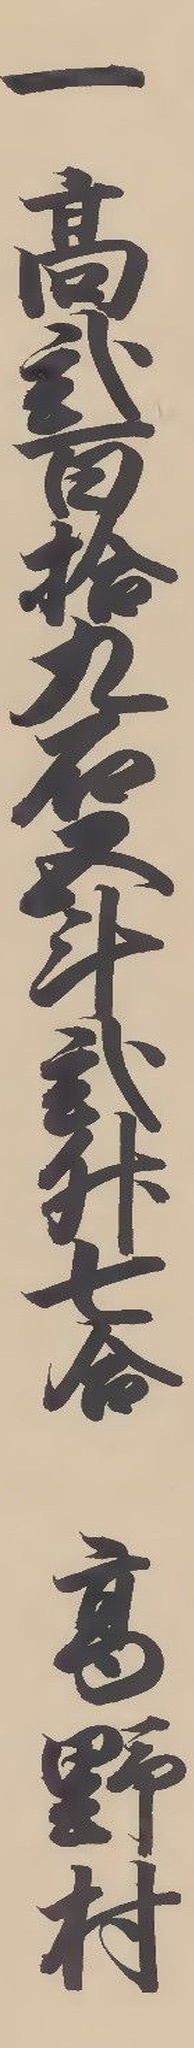一高弐百拾九石五斗弐升七合高野村
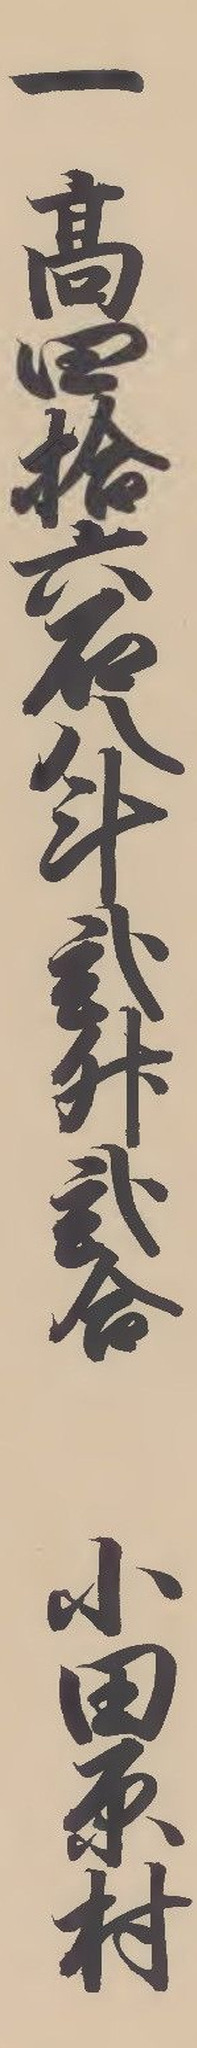一高四拾六石八斗弐升弐合小田原村
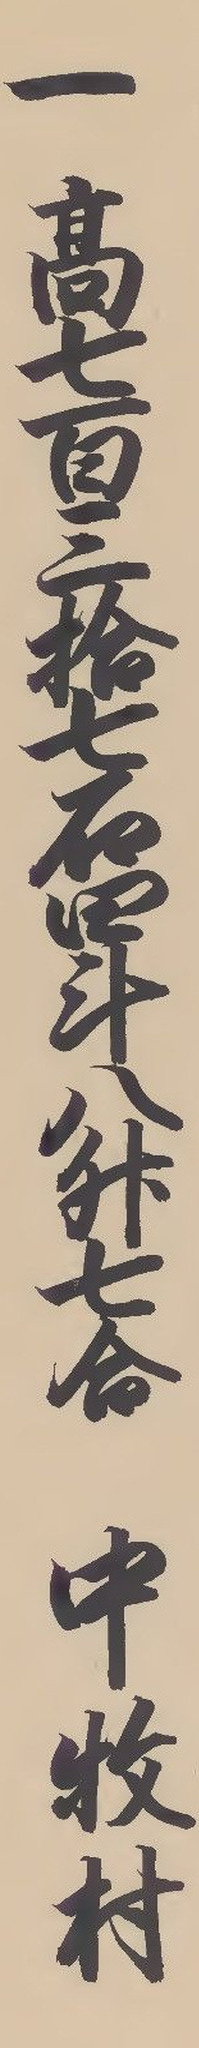一高七百三拾七石四斗八升七合中枚村

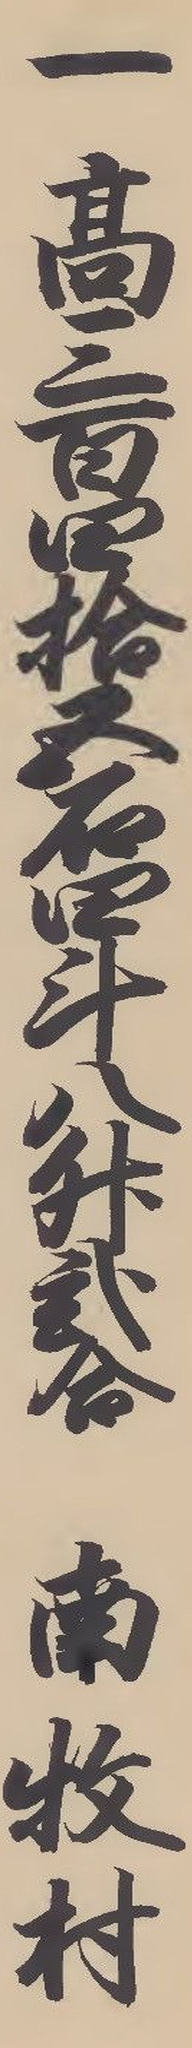一高三百四拾五石四斗八升弐合南枚村
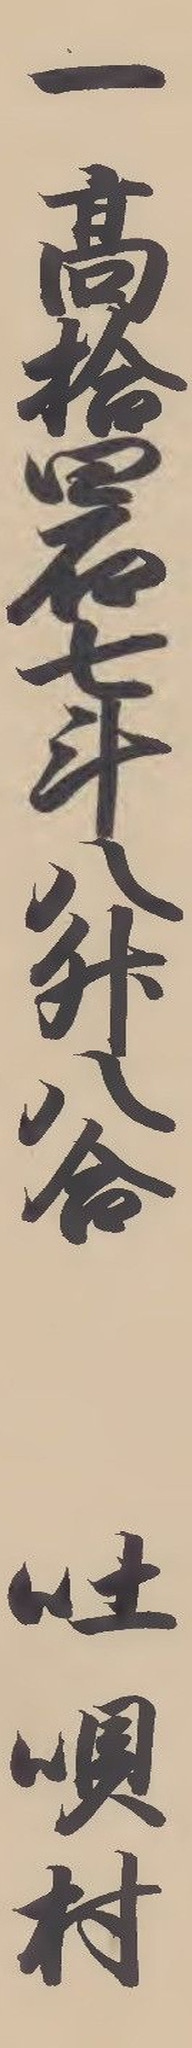一高拾四石七斗八升八合吐唄村
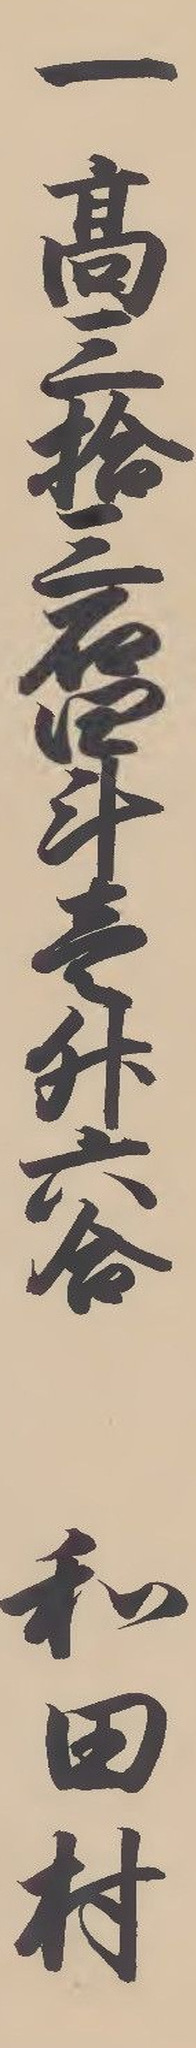一高三拾三石四斗壱升六合和田村
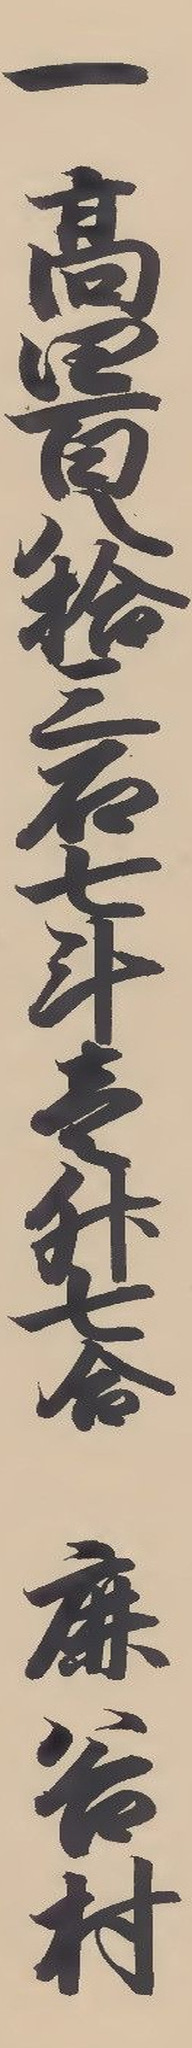一高四百八拾三石七斗壱升七合鹿谷村
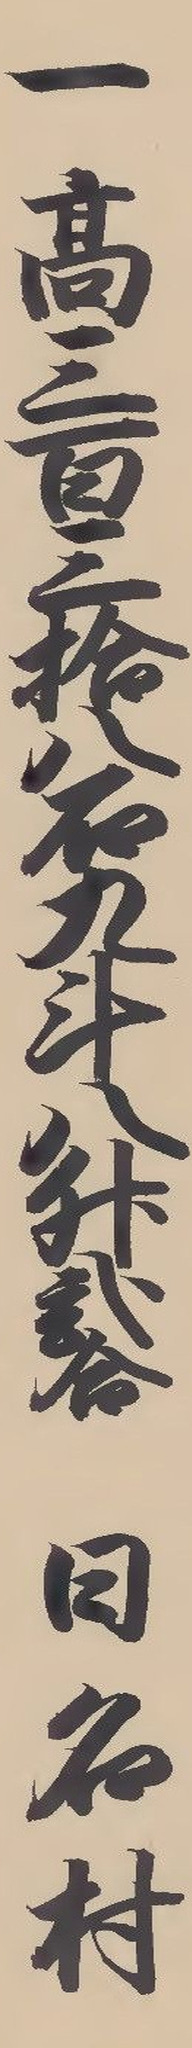一高三百三拾八石九斗八升弐合日名村
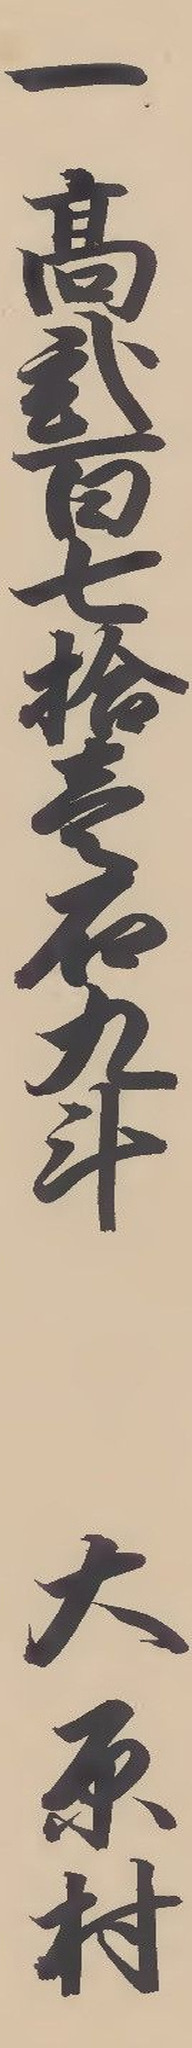一高弐百七拾壱石九斗大原村
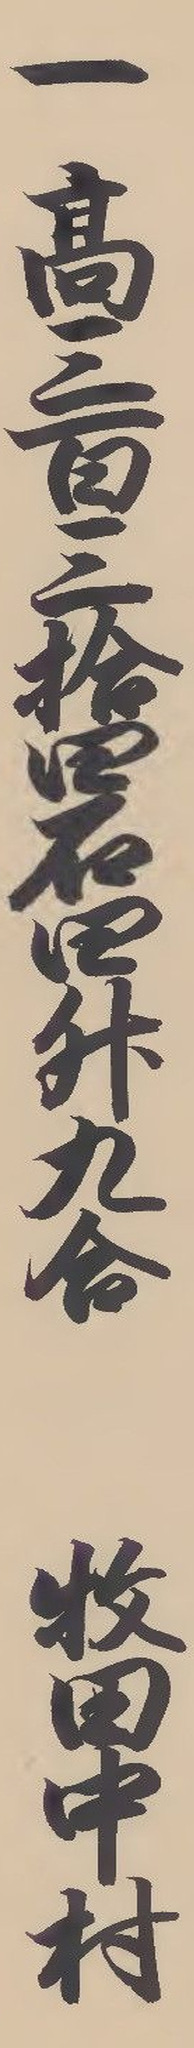一高三百三拾四石四升九合牧田中村

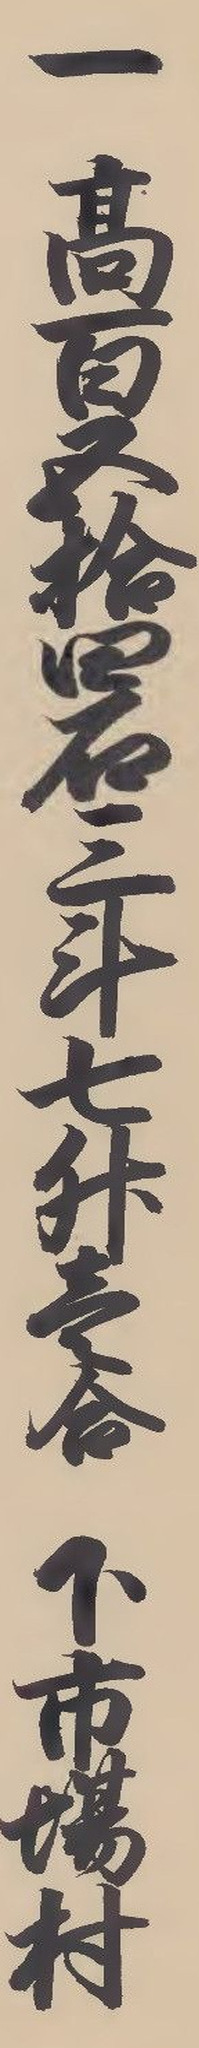一高百五拾四石三斗七升壱合下市場村
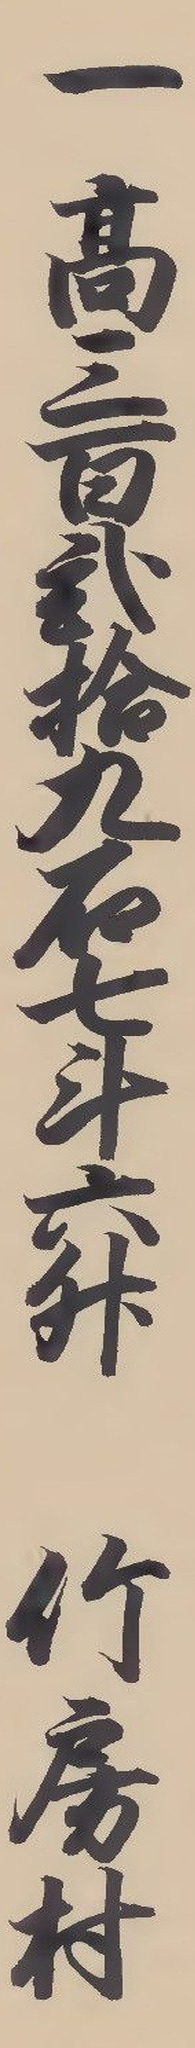一高三百弐拾九石七斗六升竹房村
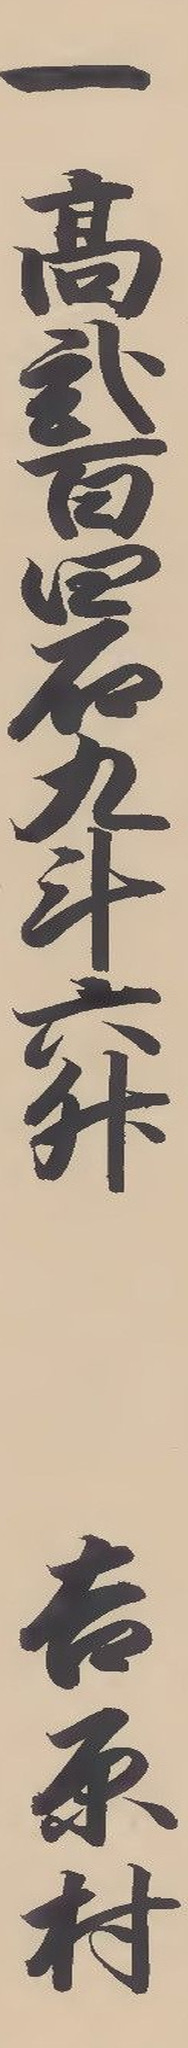一高弐百四石九斗六升吉原村
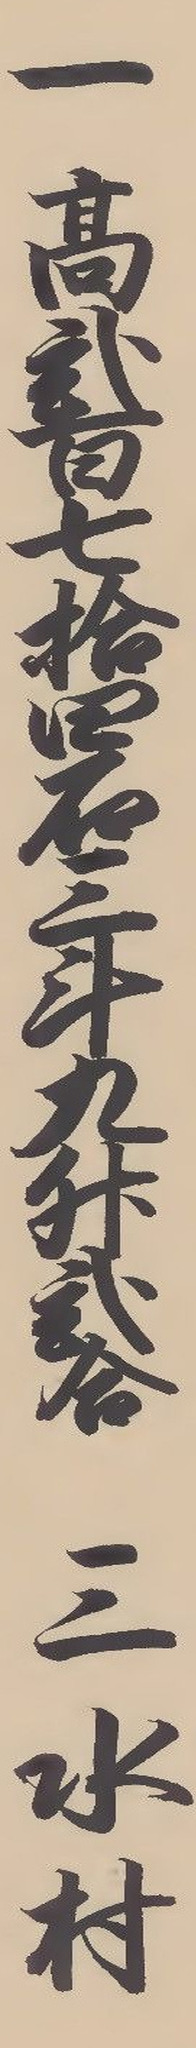一高弐百七拾四石三斗九升弐合三水村
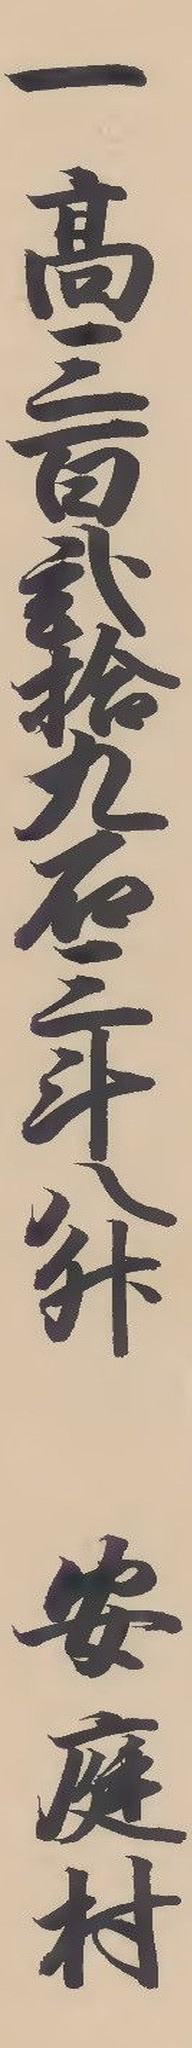一高三百弐拾九石三斗八升安庭村
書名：信濃国郷帳
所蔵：国立公文書館 National Archives of Japan
